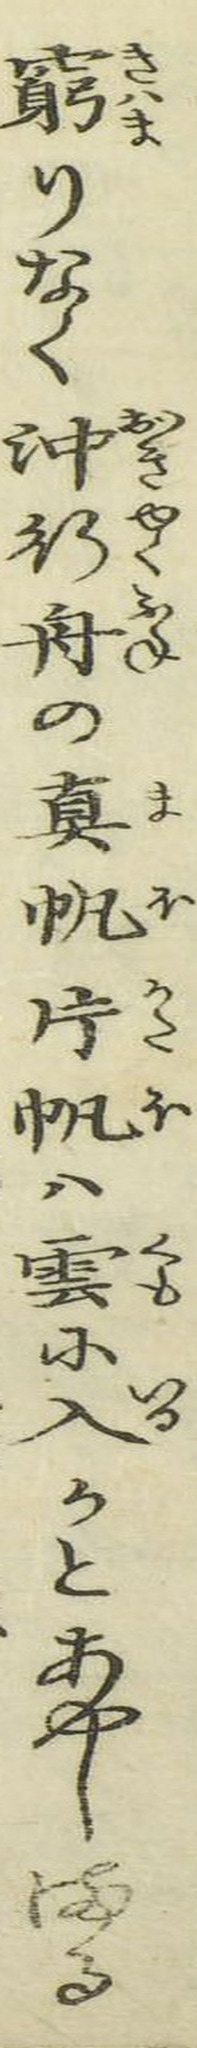窮りなく沖行舟の真帆片帆は雲に入かとあやしまる
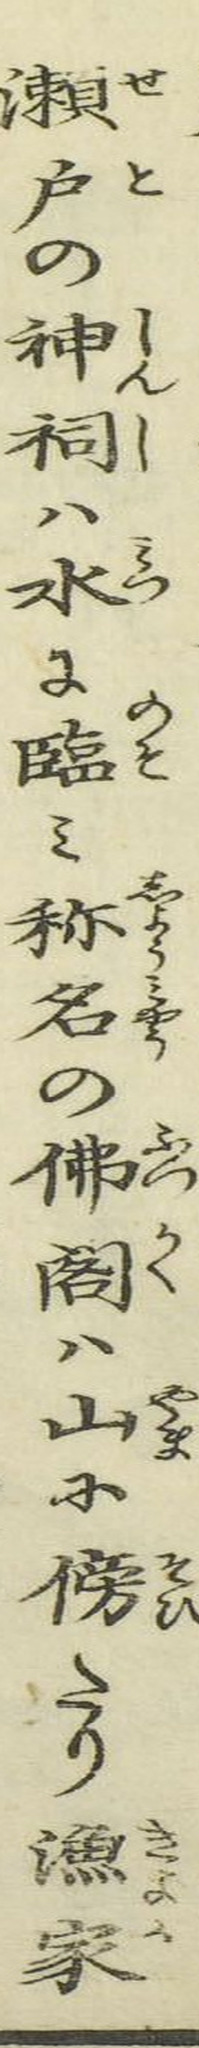瀬戸の神祠は水に臨み称名の佛閣は山に傍たり漁家
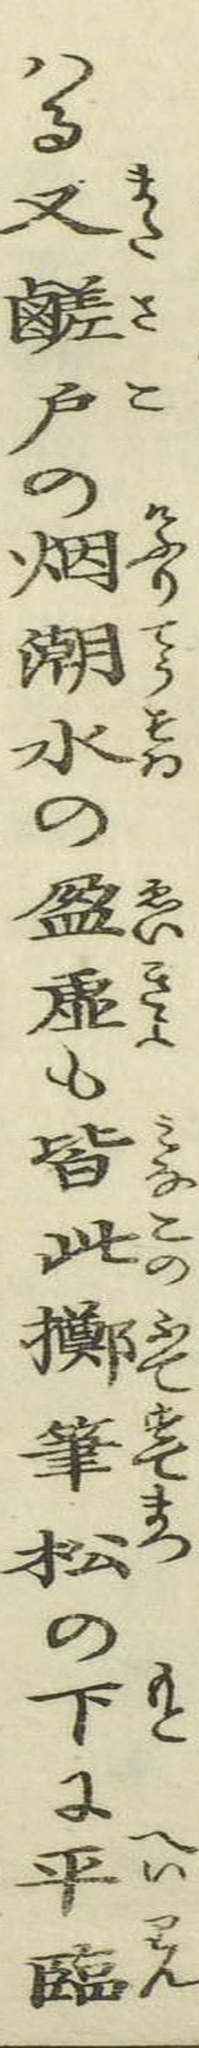はる又鹺戸の烟潮水の盈虚も皆此擲筆松の下に平臨
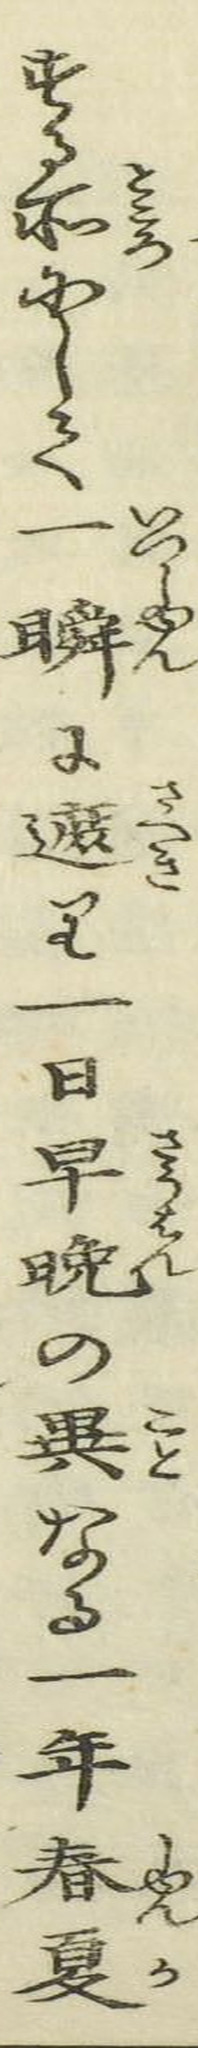する所にして一瞬に遮り一日早晩の異なる一年春夏
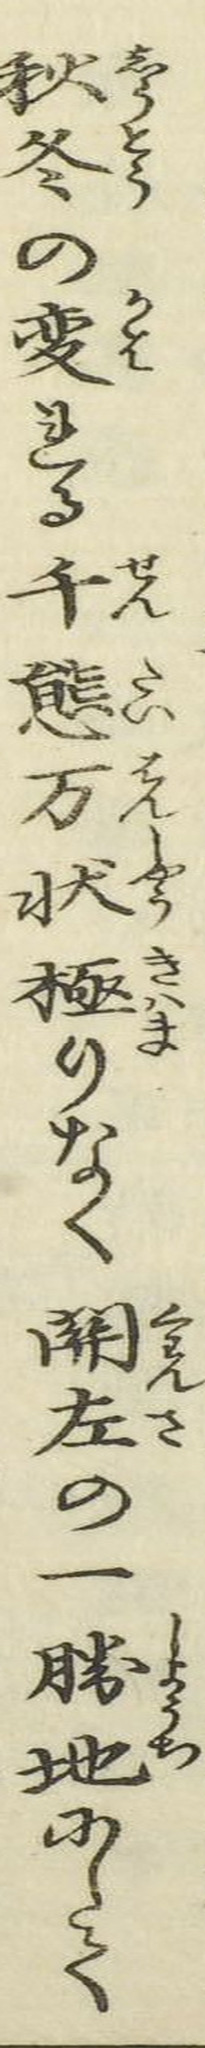秋冬の変れる千態万状極りなく關左の一勝地にして
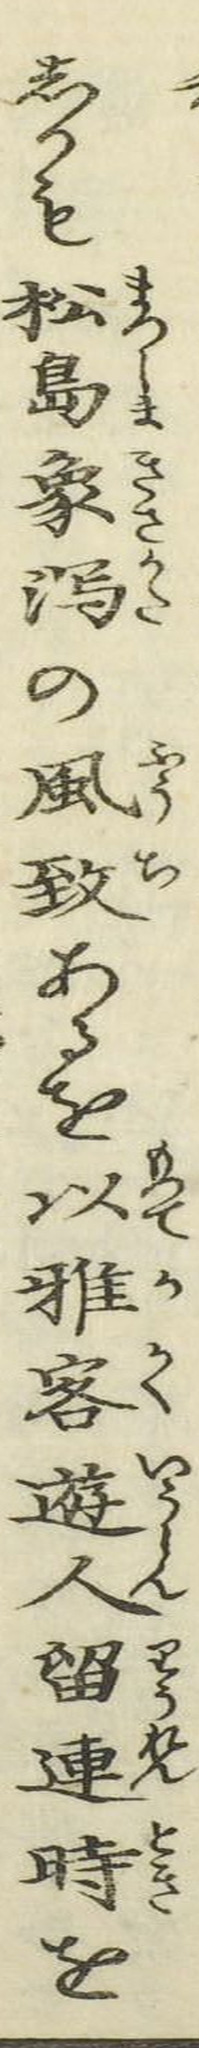しかも松島象潟の風致あるを以雅客遊人留連時を
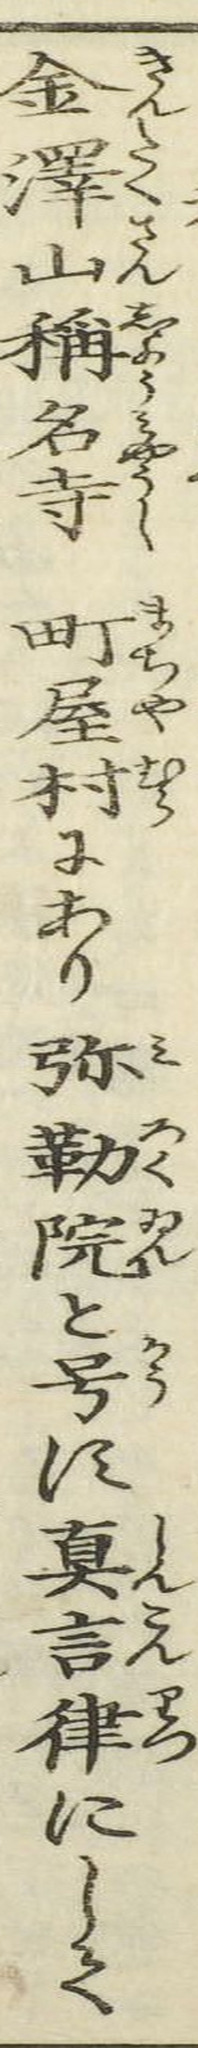金澤山稱名寺町屋村にあり弥勒院と号す真言律にして
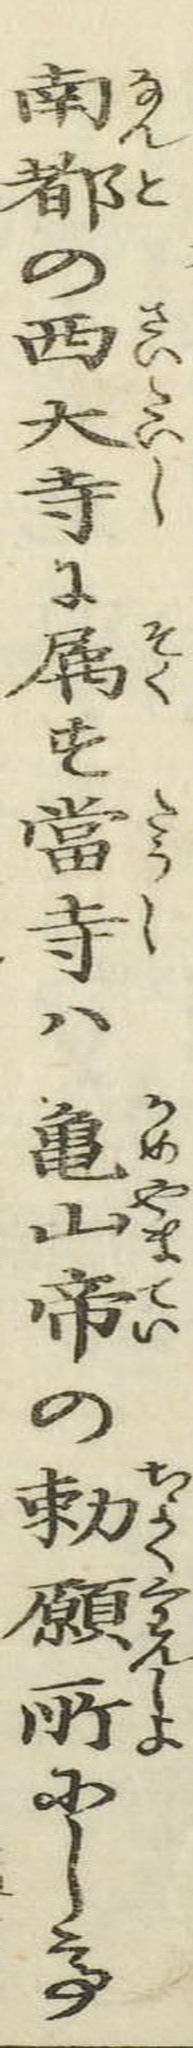南都の西大寺に属す當寺は亀山帝の勅願所にして
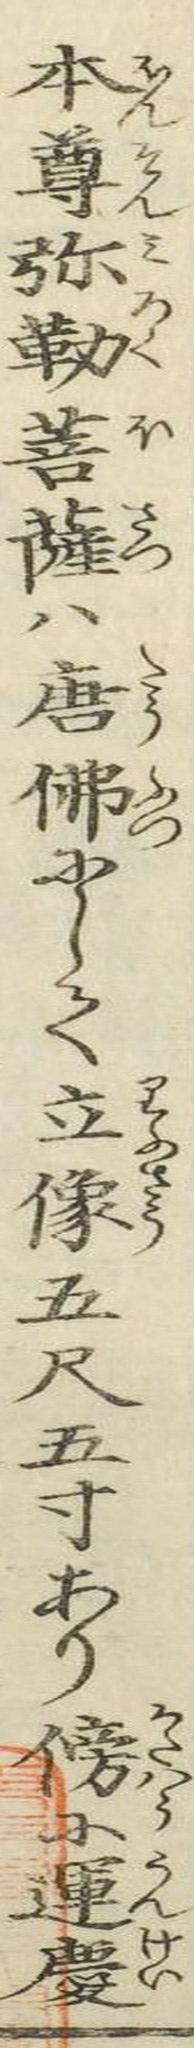本尊弥勒菩薩は唐佛にして立像五尺五寸あり傍に運慶
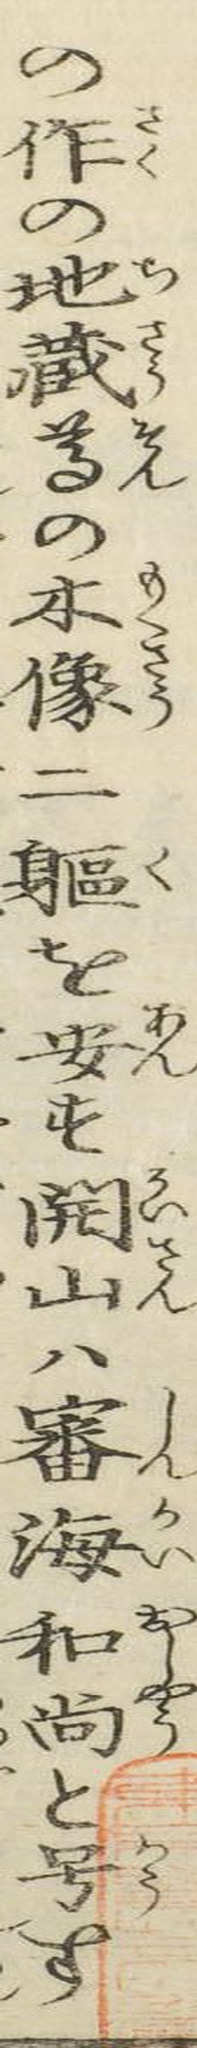の作の地蔵尊の木像二軀を安す開山は審海和尚と号す
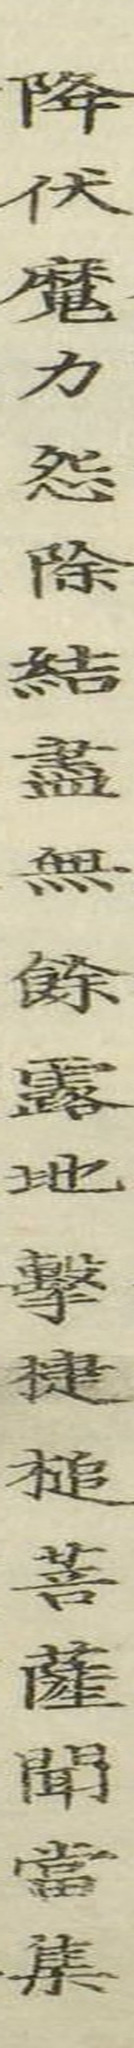降伏魔力怨除結盡無餘露地撃捷槌菩薩聞當集
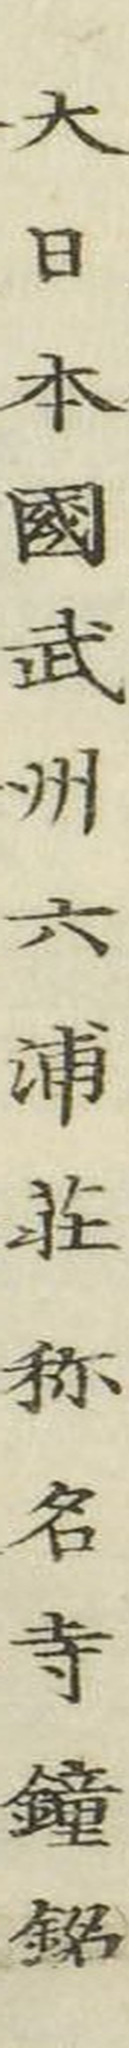大日本國武州六浦荘称名寺鐘銘
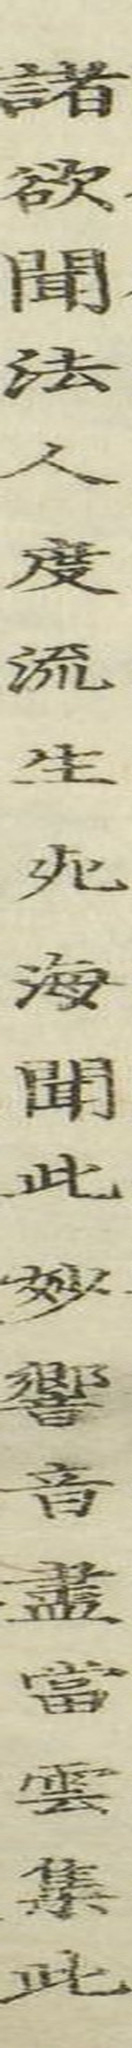諸欲聞法人度流生死海聞此妙響音盡當雲集此
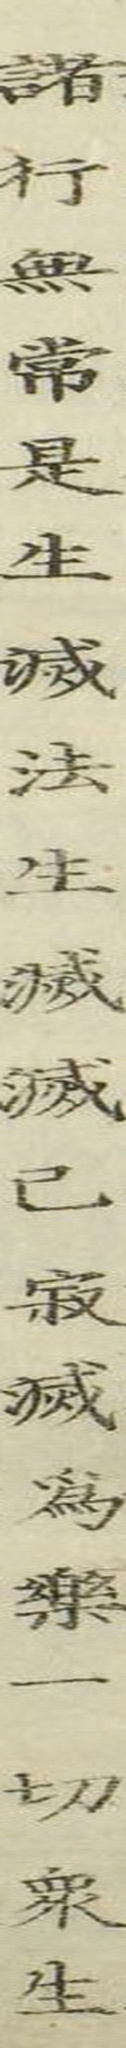諸行無常是生滅法生滅滅已寂滅爲樂一切衆生
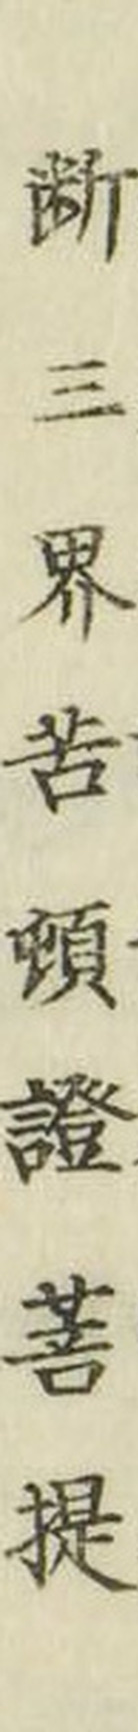断三界苦頓證菩提
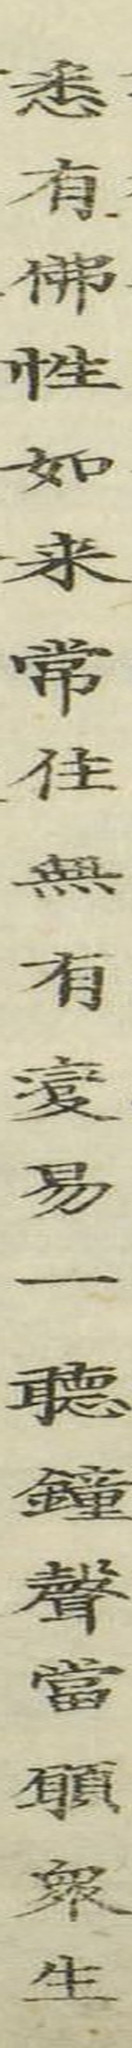悉有佛性如来常住無有變易一聽鐘聲當願衆生
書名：江戸名所図会 20巻 巻之6
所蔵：東京学芸大学教育コンテンツアーカイブ
